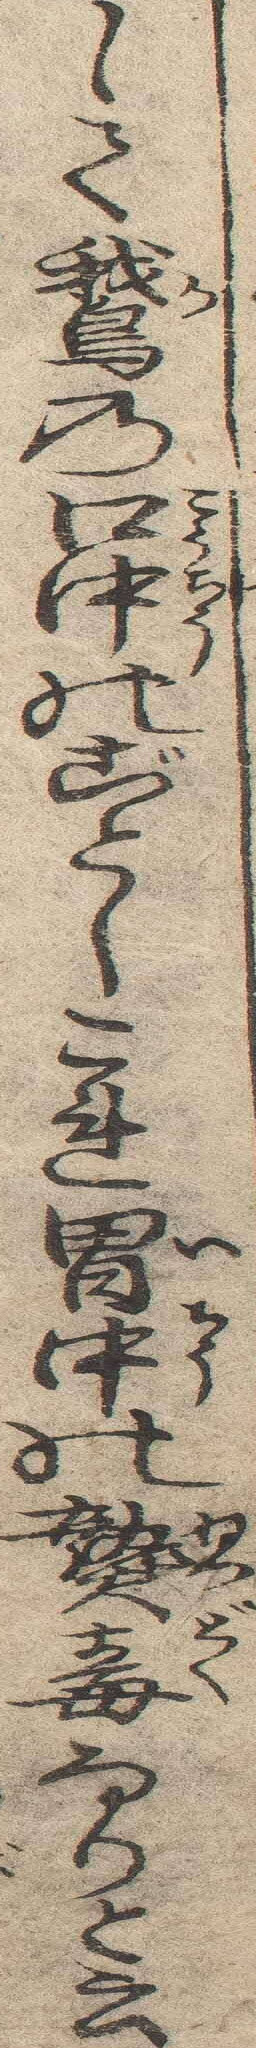して鵞の口中のごとしこれ胃中の熱毒なりと云
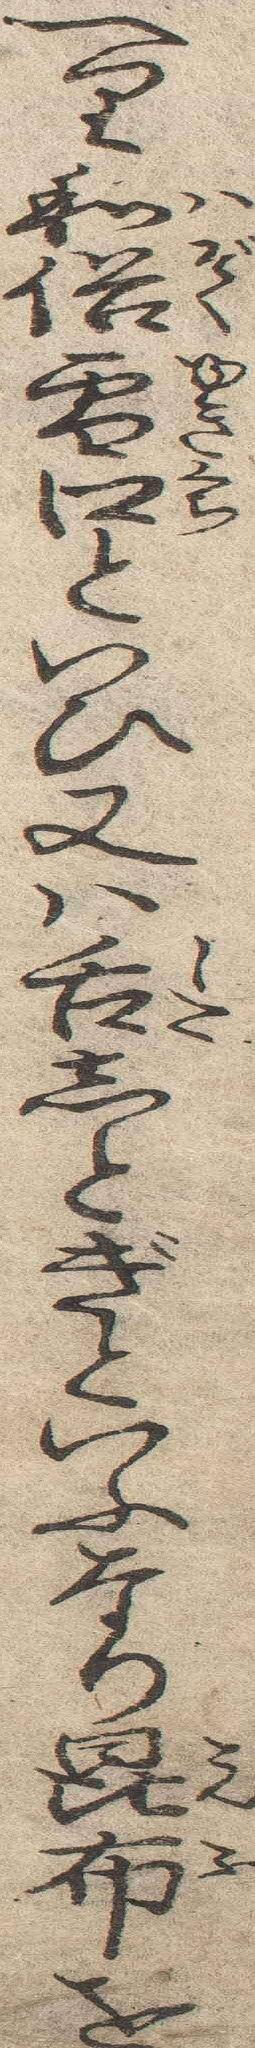へり和俗雪口といひ又は舌しとぎといふなり昆布を
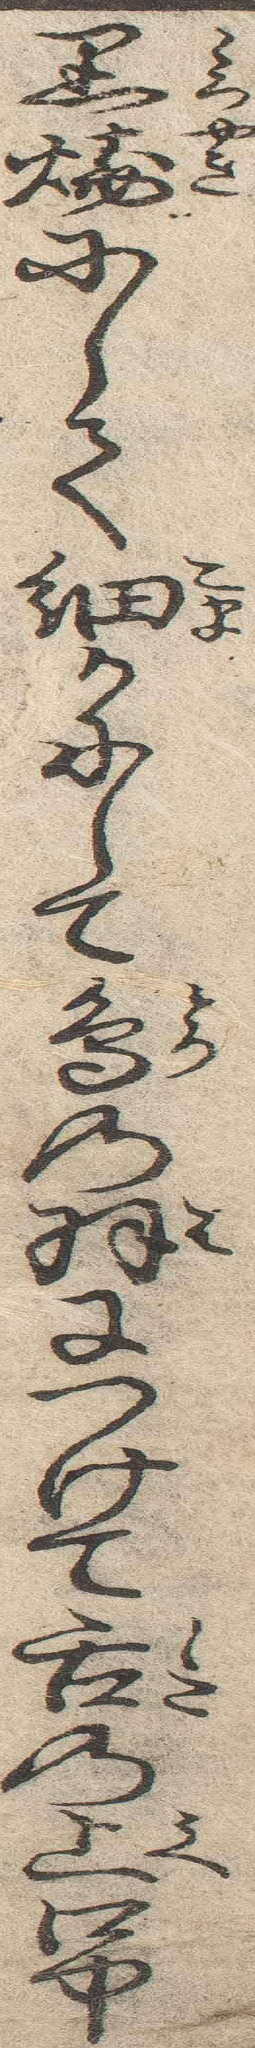黒焼にして細かにして鳥の羽につけて舌の上口中
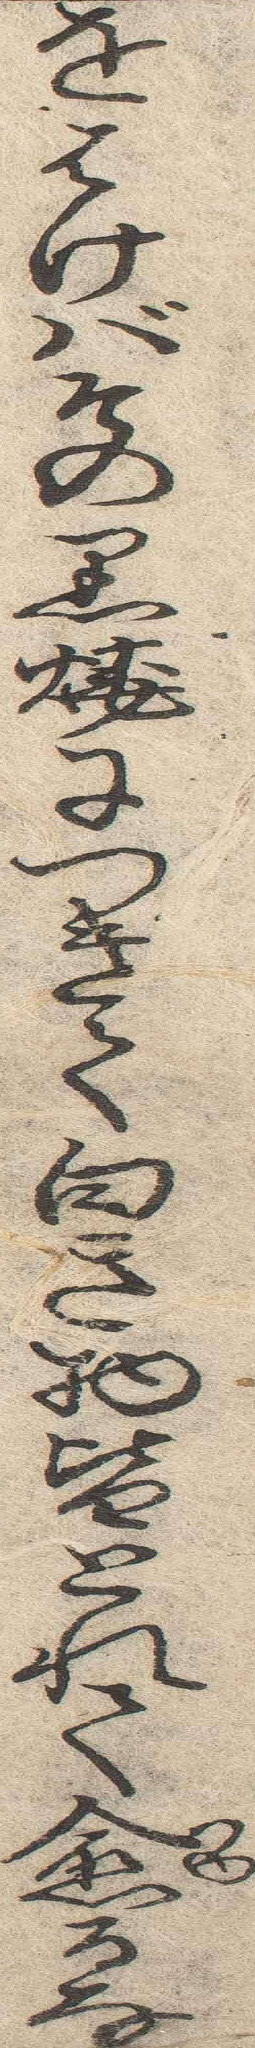をはけばその黒焼につきて白き物皆とれて愈るな
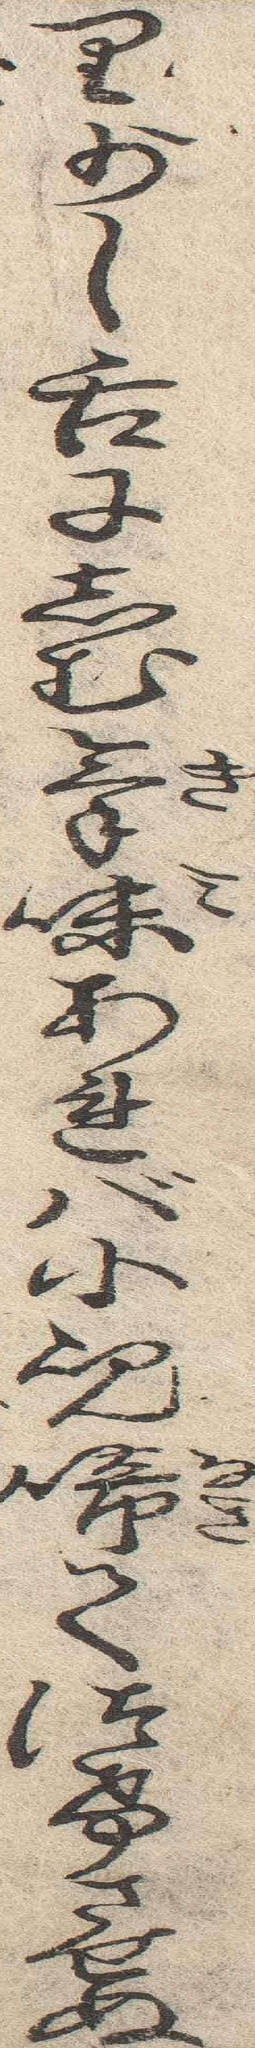り少し舌にしむ気味あれば小児啼てつけさせぬ
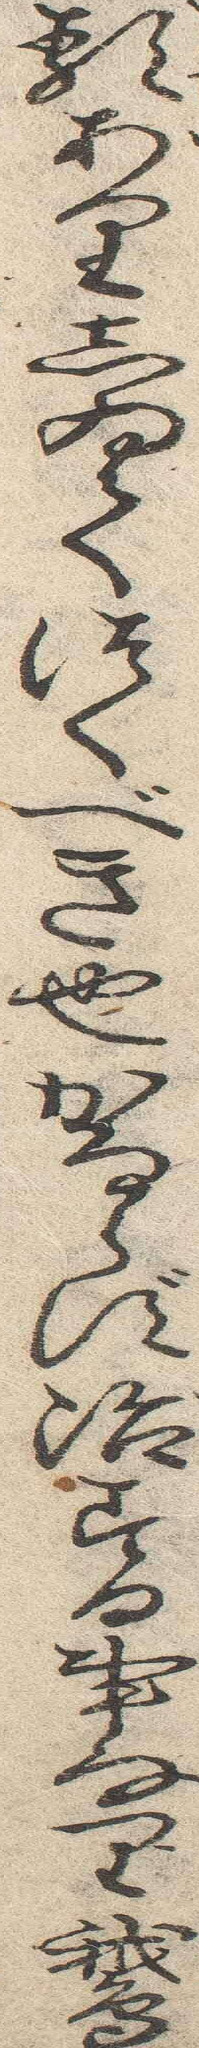類ありしゐてつくべき也かならず治する事なり鵞
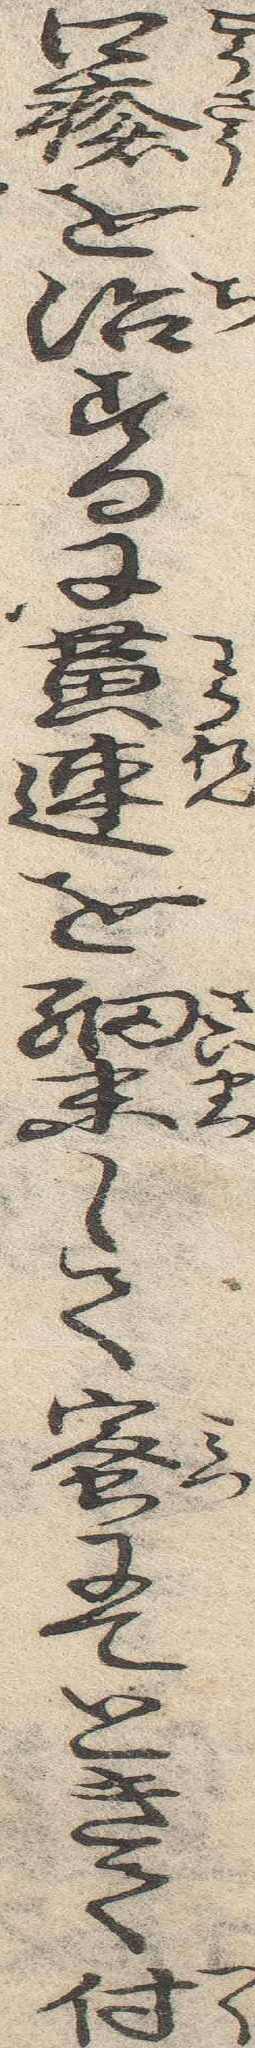口瘡を治するに黄連を細末して蜜にてときて付
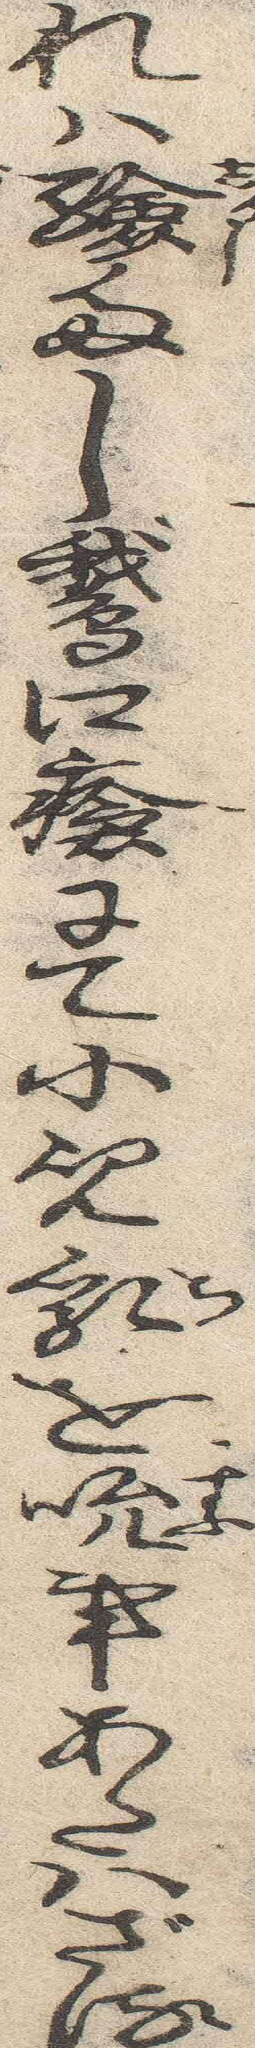れは験多し鵞口瘡にて小児乳を吮事あたはざる
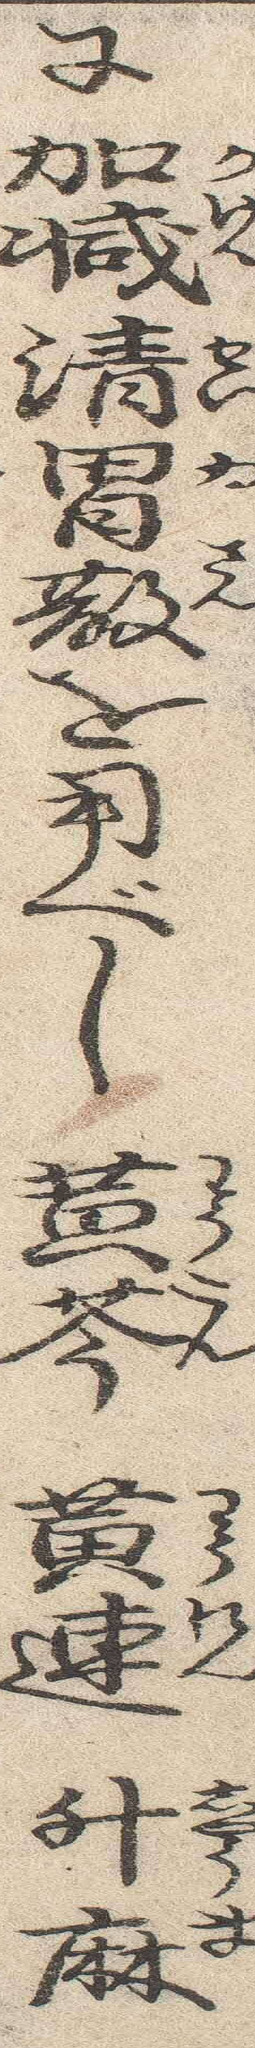に加減清胃散を用べし黄芩黄連升麻
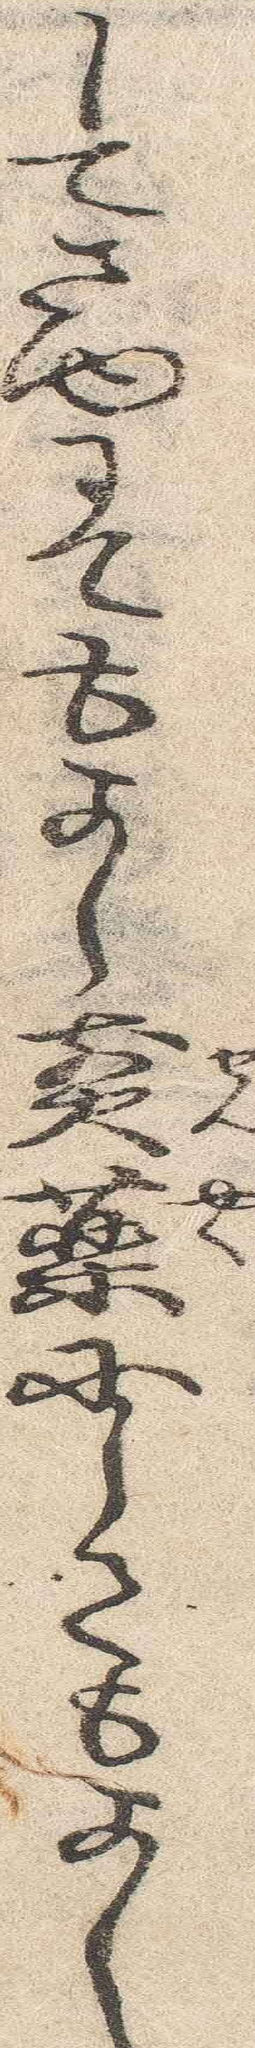してさゆにてもよし煎薬にしてもよし
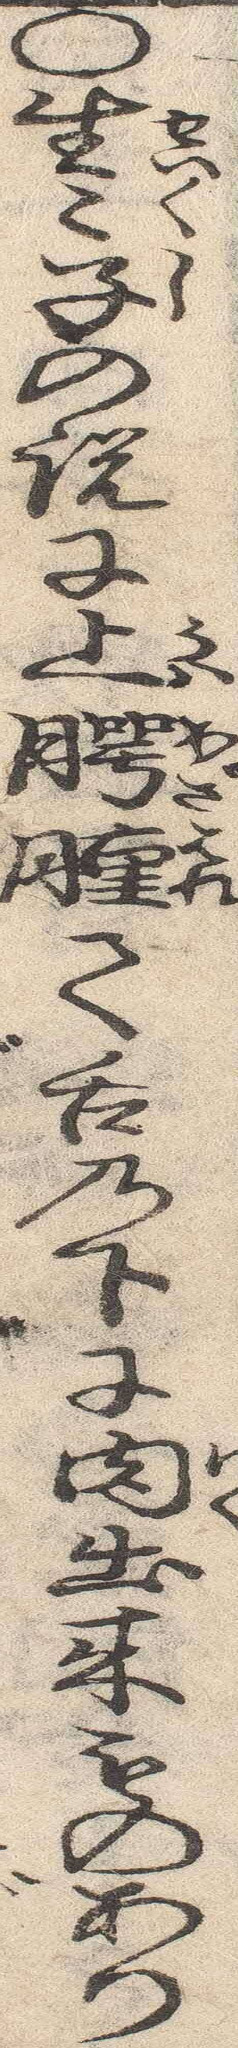○生々子の説に上腭腫て舌の下に肉出来ものあり
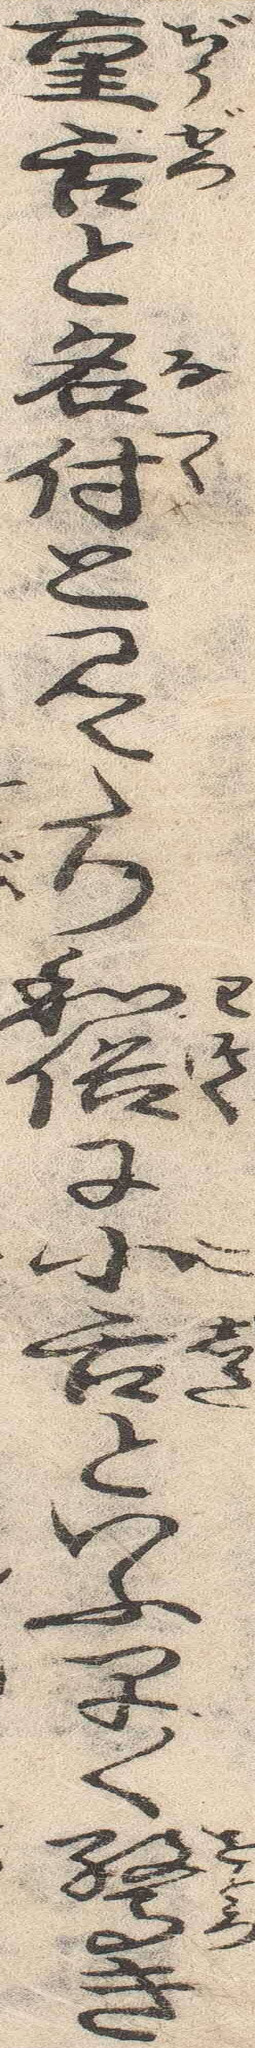重舌と名付と見えたり和俗に小舌といふ早く驚き
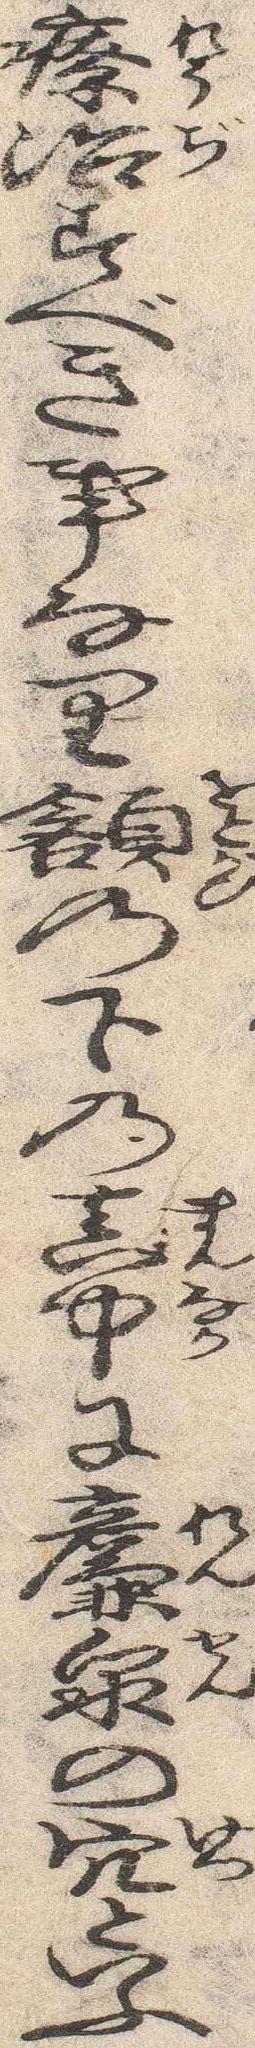療治すべき事なり頷の下の真中に廉泉の穴といふ
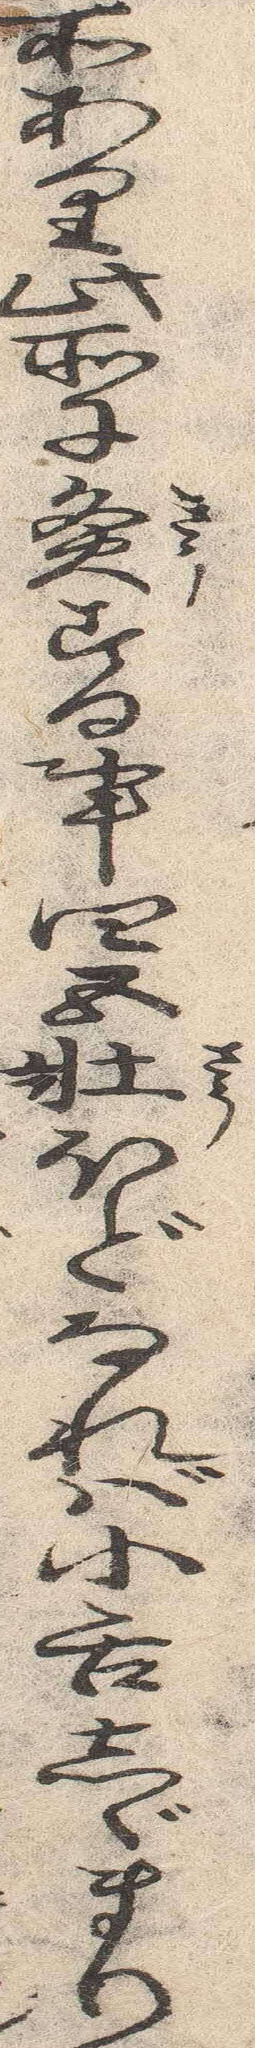所あり此所に灸する事四五壮ほどなれば小舌しゞまり
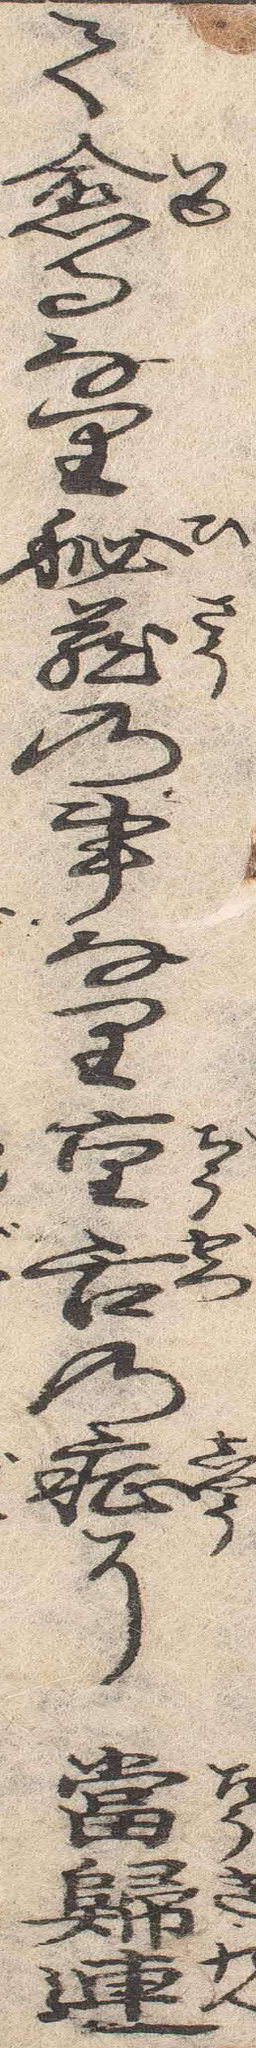て愈るなり秘蔵の事なり重舌の症に当帰連
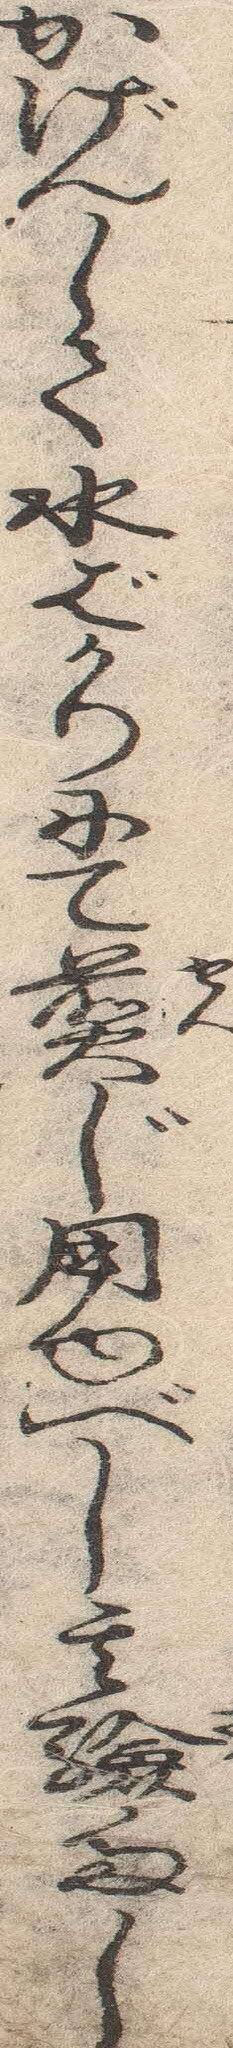かげんして水ばかりにて煎じ用ゆべし其験多し
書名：小児必用養育草
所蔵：東京学芸大学附属図書館 国文学研究資料館
